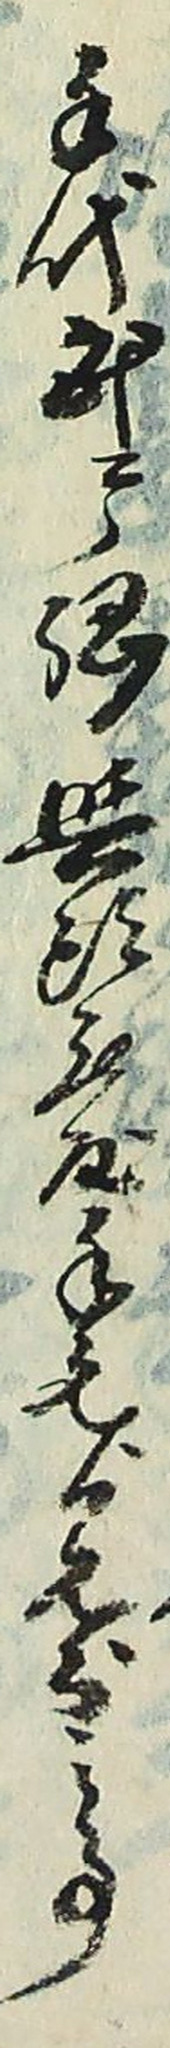手代當テ認メ與頭庄屋手元ゟ見分之事
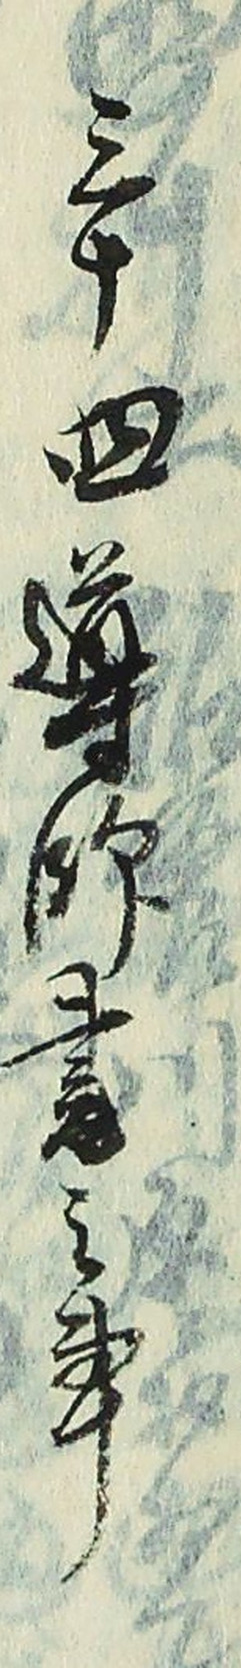三十四導師書之事
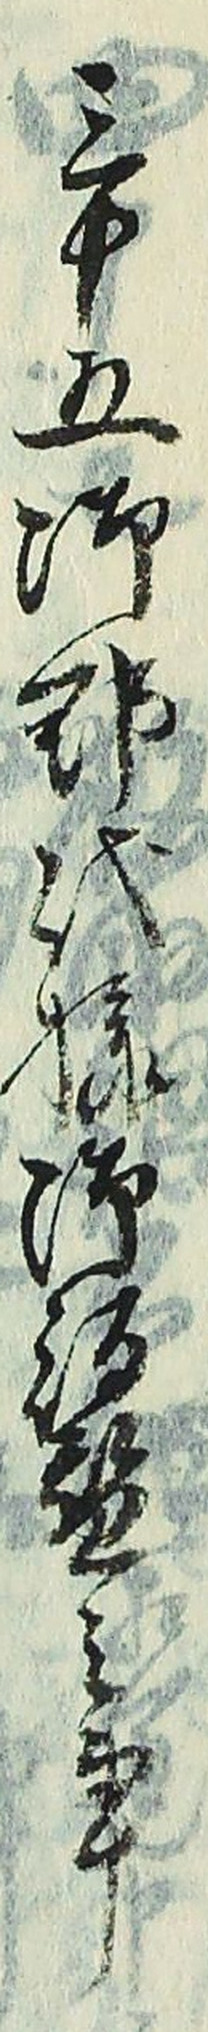三十五御郡代様御役替之事
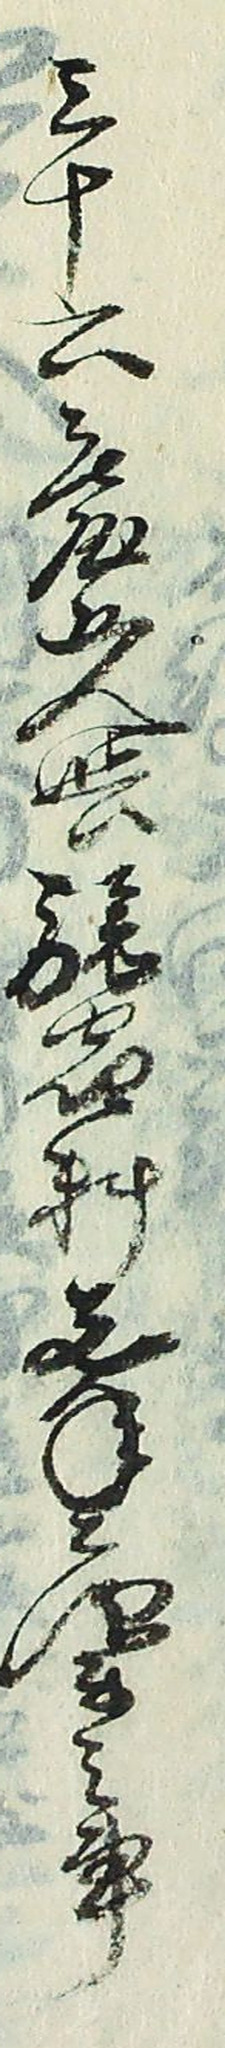三十六庄屋五人與旅宿料先年被仰付之事
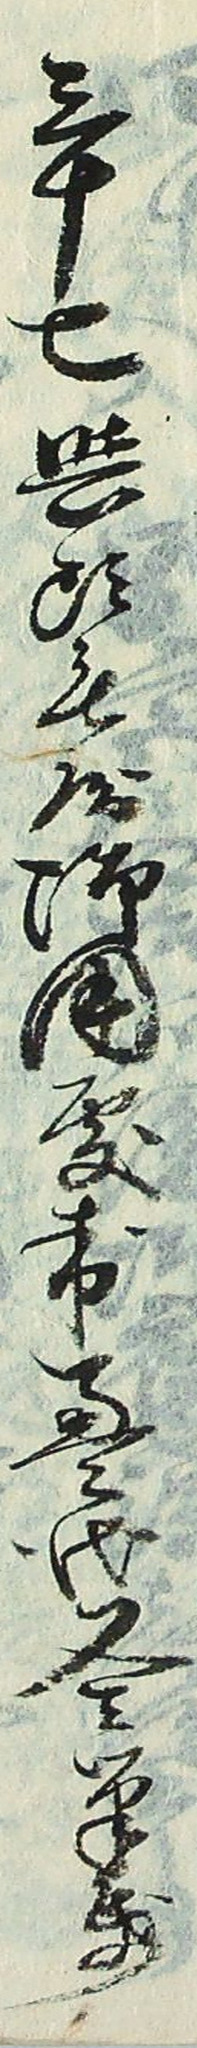三十七與頭庄屋御用處本畳代又者筆帋
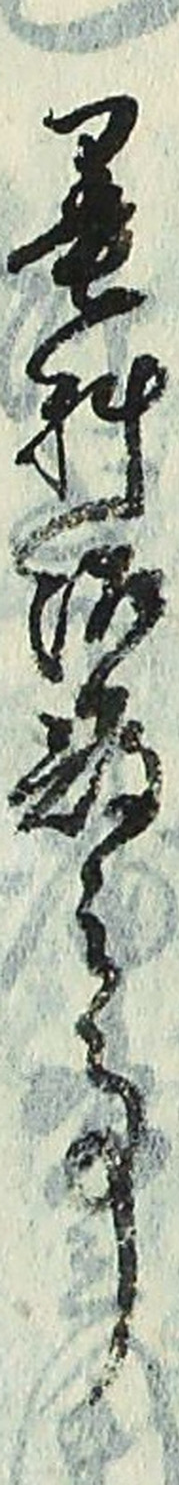墨料御尋之事
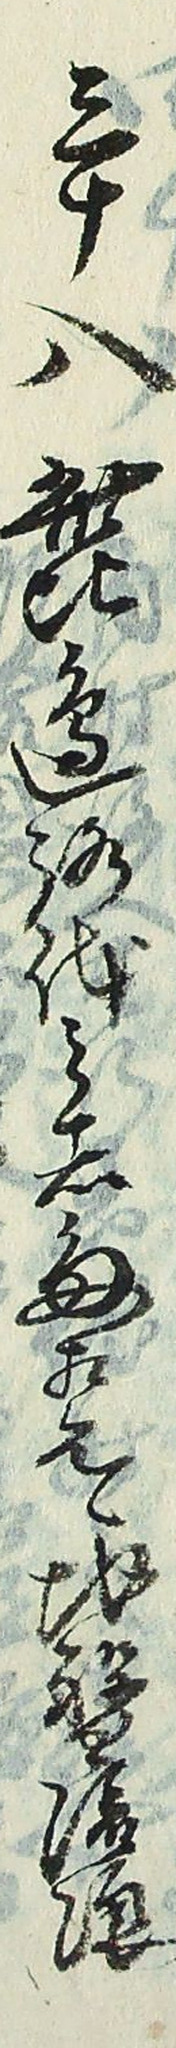三十八此比邊路体之者多相見候地盤流浪
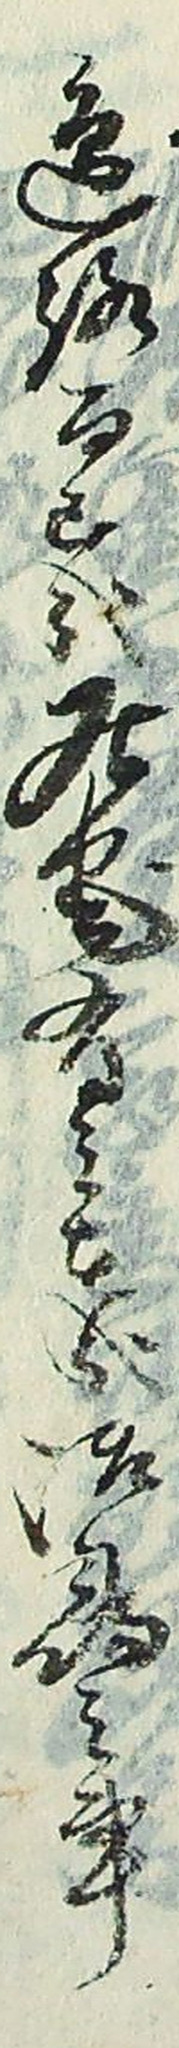邊路而已哉居宅有之者哉御尋之事
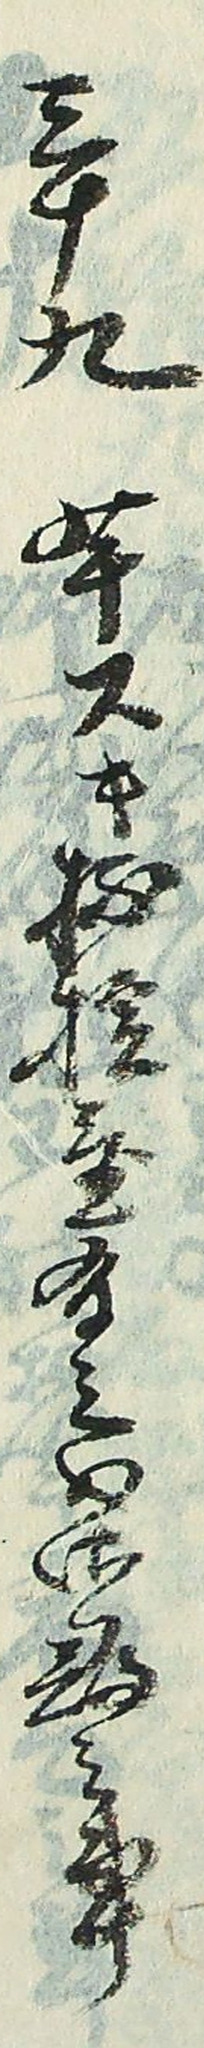三十九芋スキ抔控置有之義御尋之事

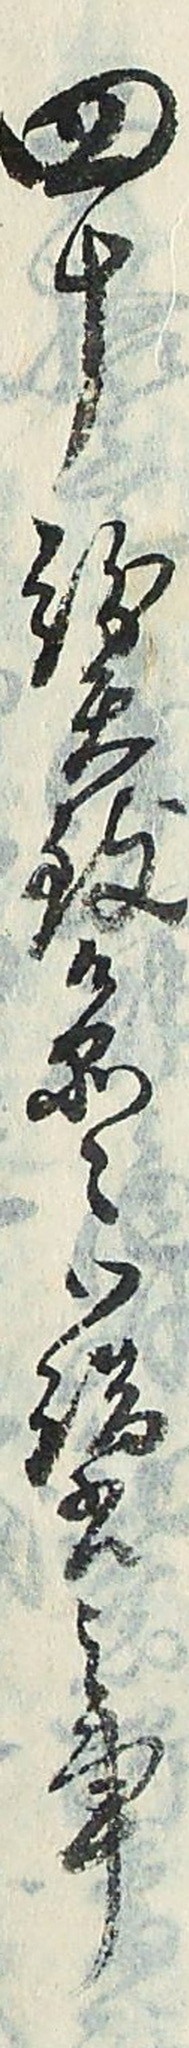四十紛失致候品々御端書之事
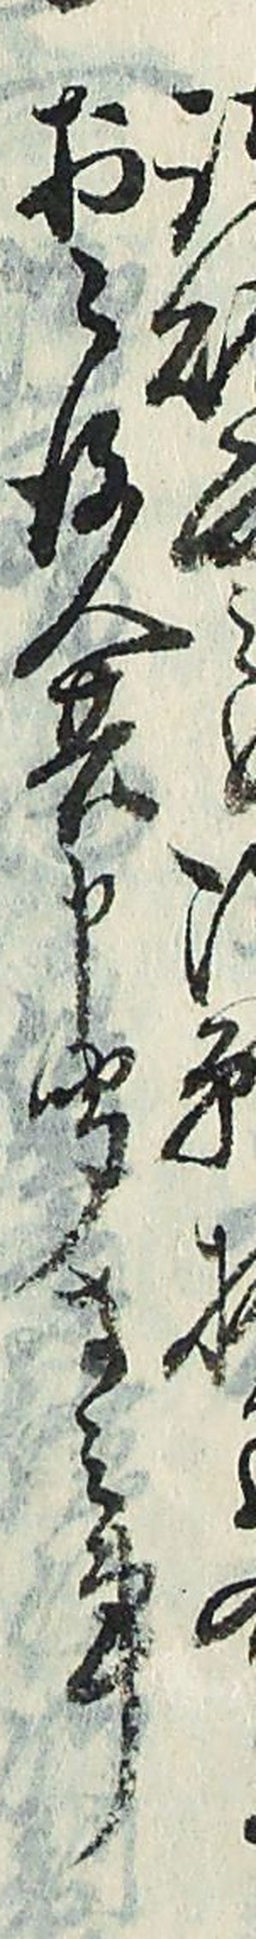村々役人共申聞方之事
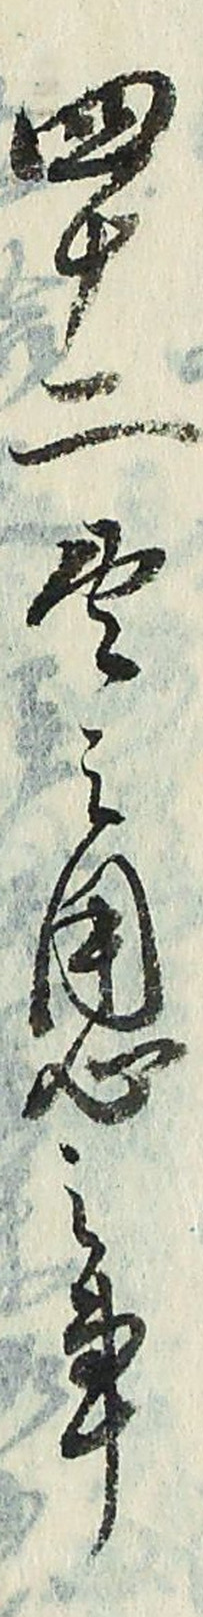四十二火之用心之事
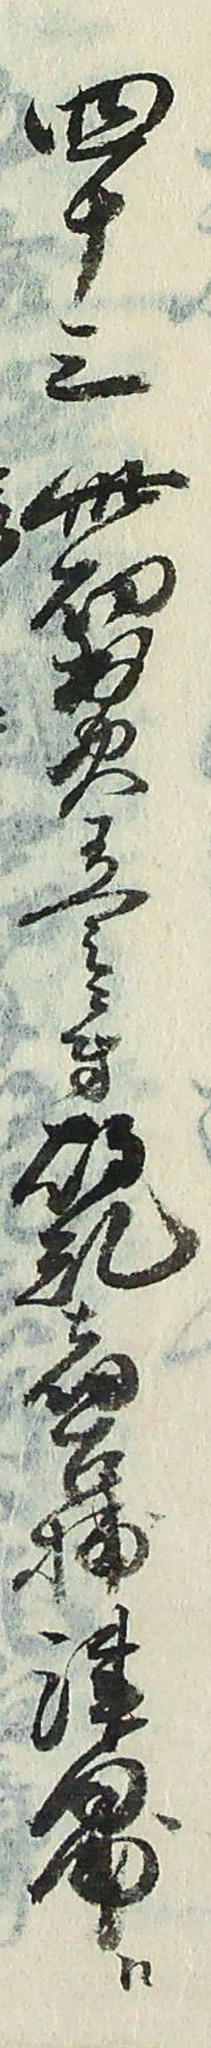四十三此砌出火有之ニ付胡乱者召捕津田浦江
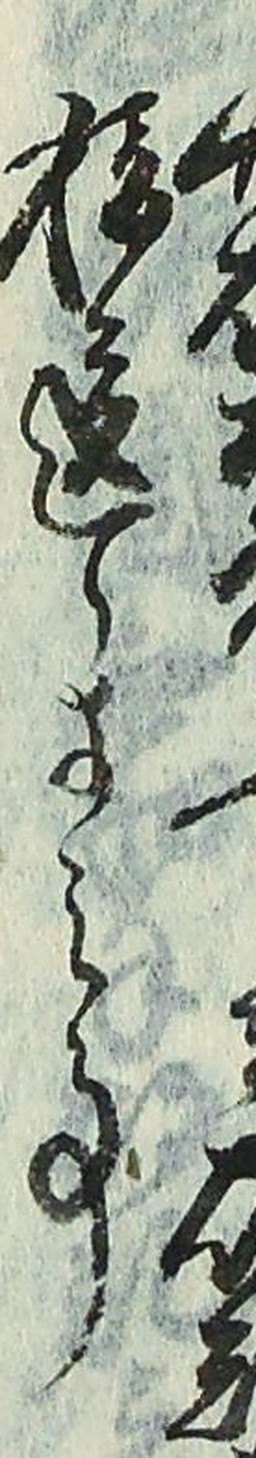積送り方之事
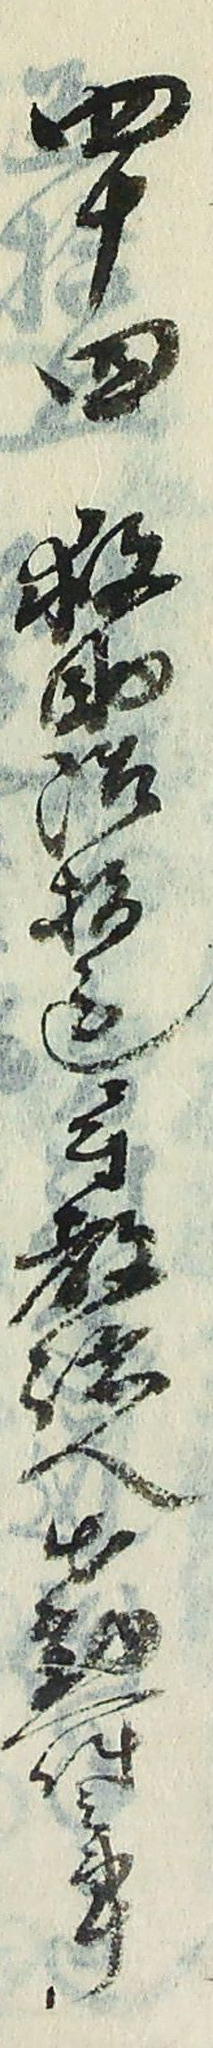四十四救助御指延ニ付教諭人出勤一件之事
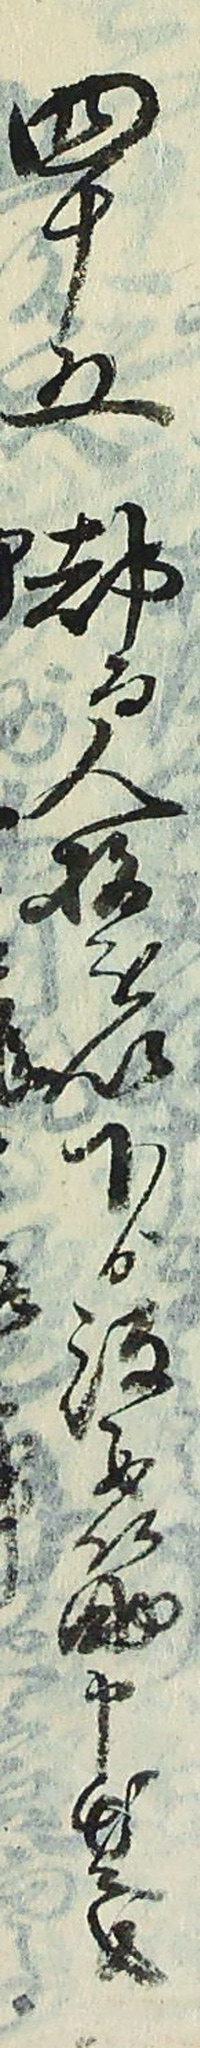四十五都而人指を以下ゟ役義筋申出之義
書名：諸御趣意書并御下知向之写
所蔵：鳴門教育大学 Naruto University of Education
